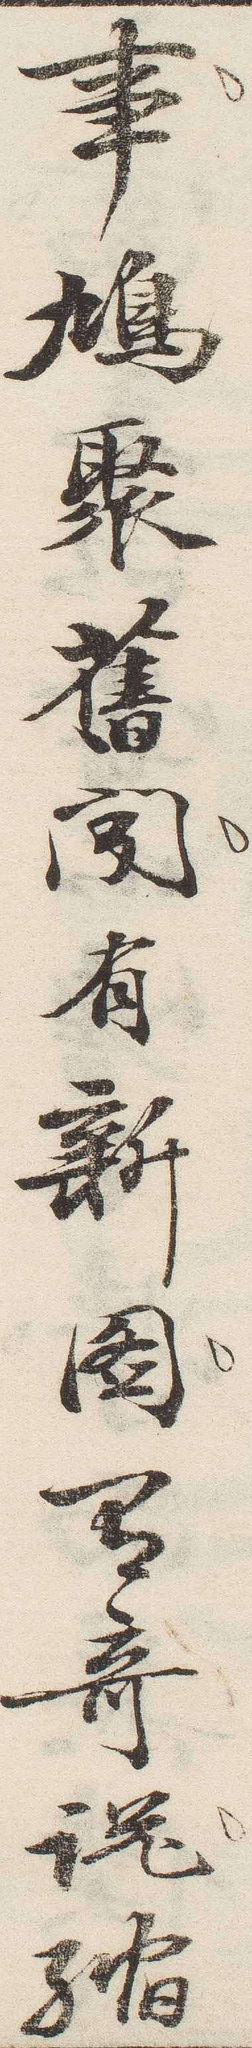事。鳩聚旧聞。有新図。有奇説。縮
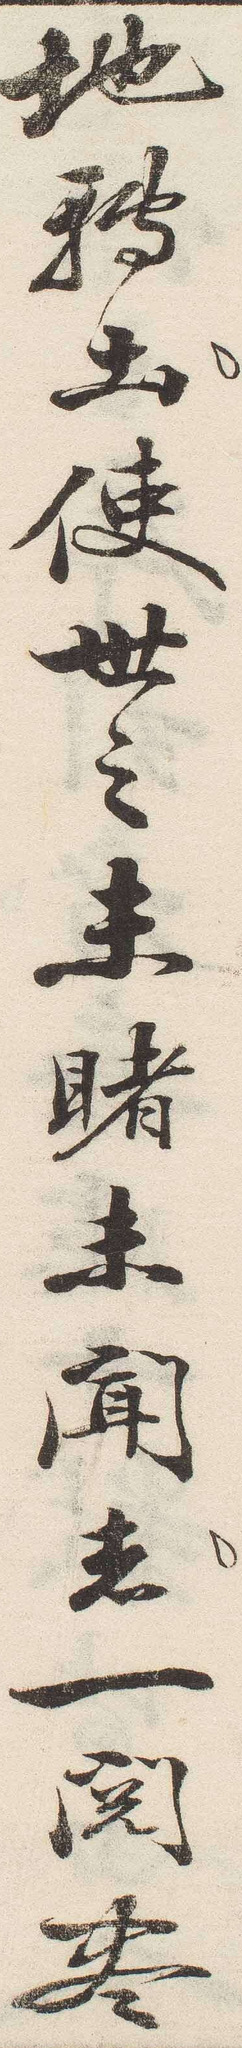地転土。使世之未睹未聞者。一閲尽
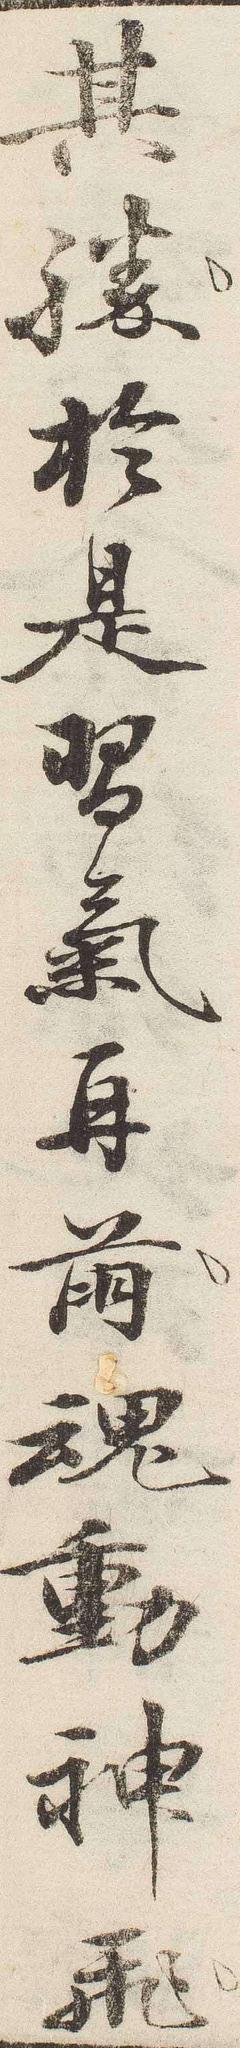其勝。於是習気再萌。魂動神飛。
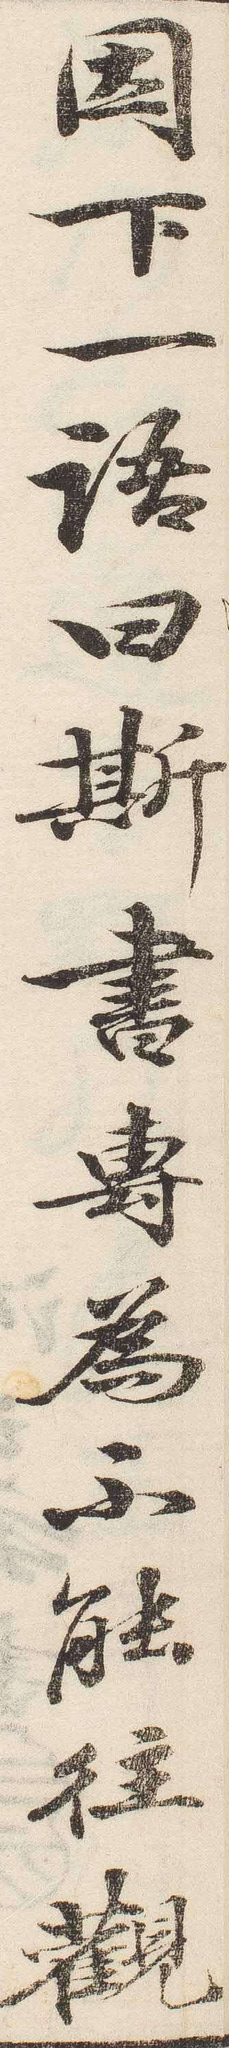因下一語曰。斯書専為不能往観
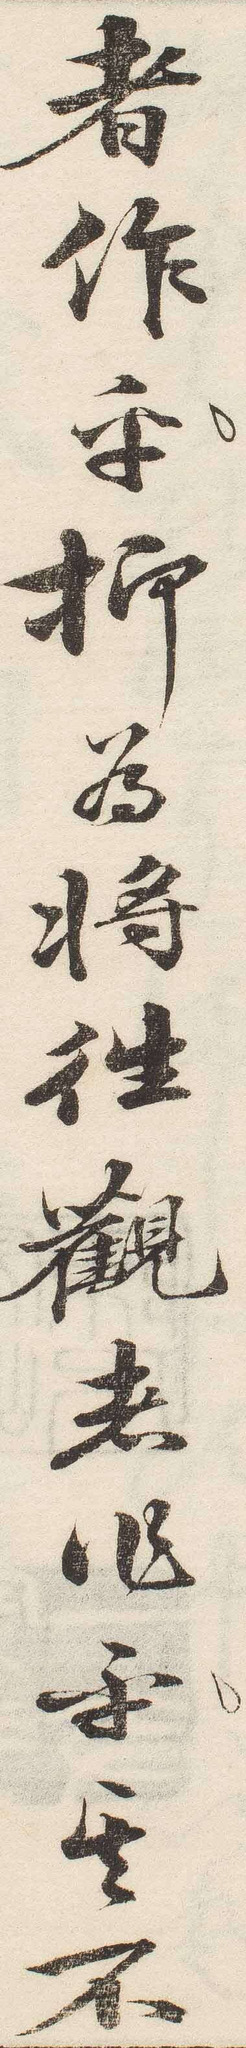者作乎。抑為将往観者作乎。其不
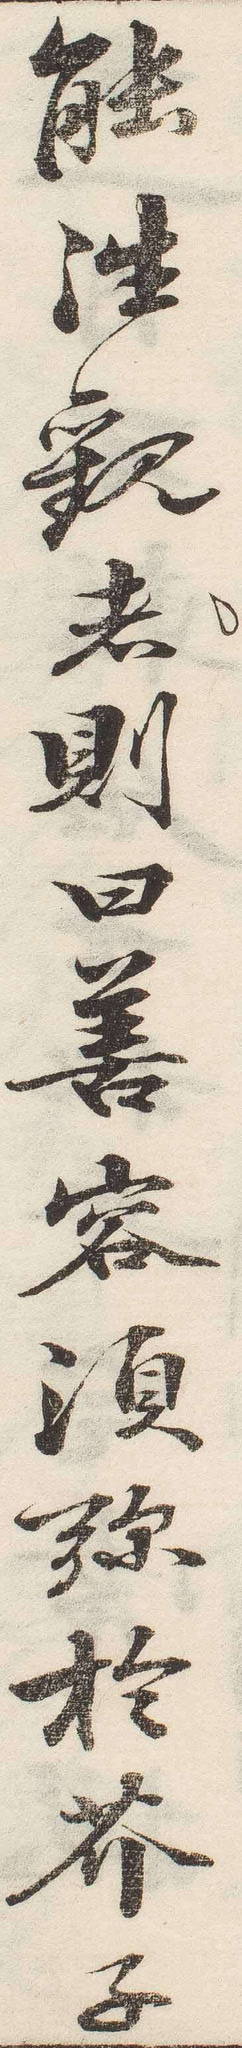能往観者。則曰善容須弥於芥子
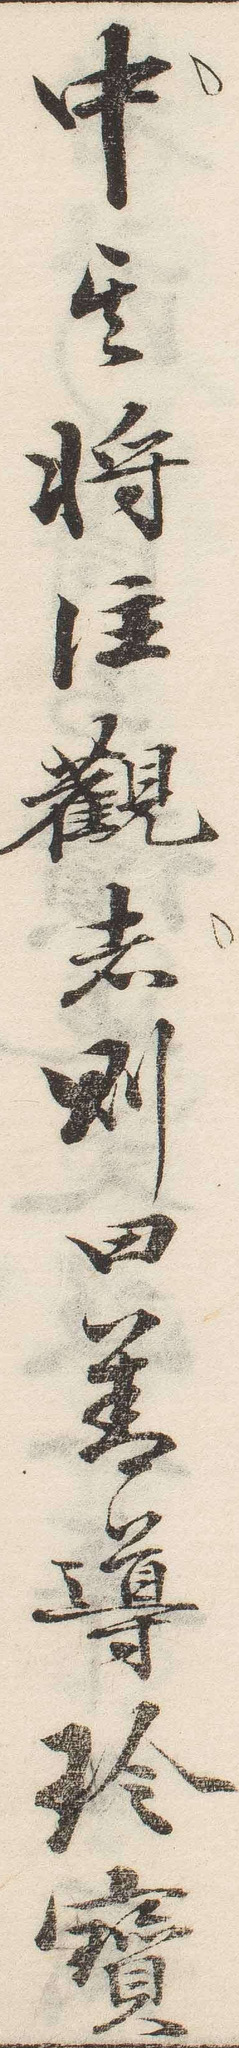中。其将往観者。則曰善導玲宝

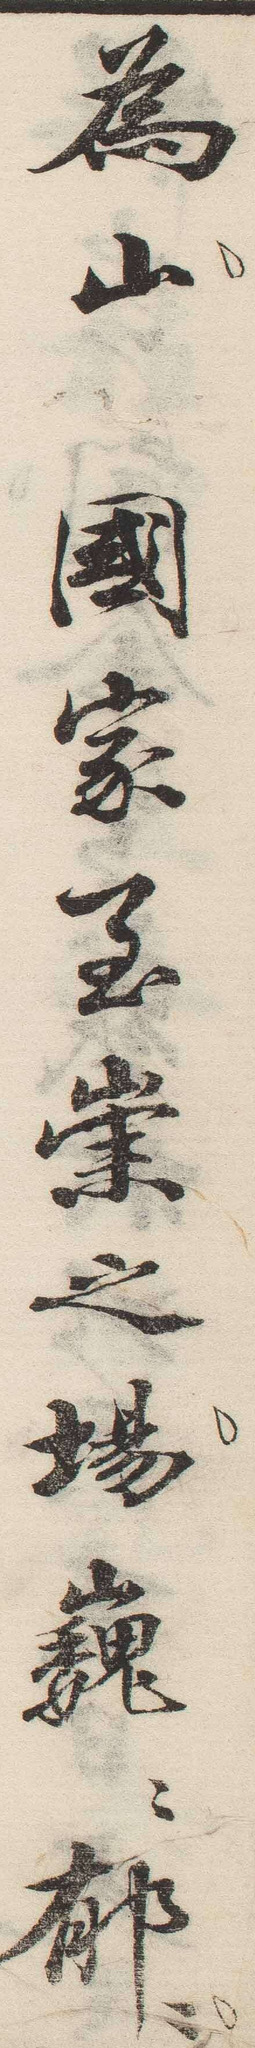為山。国家至崇之場。巍々郁々。
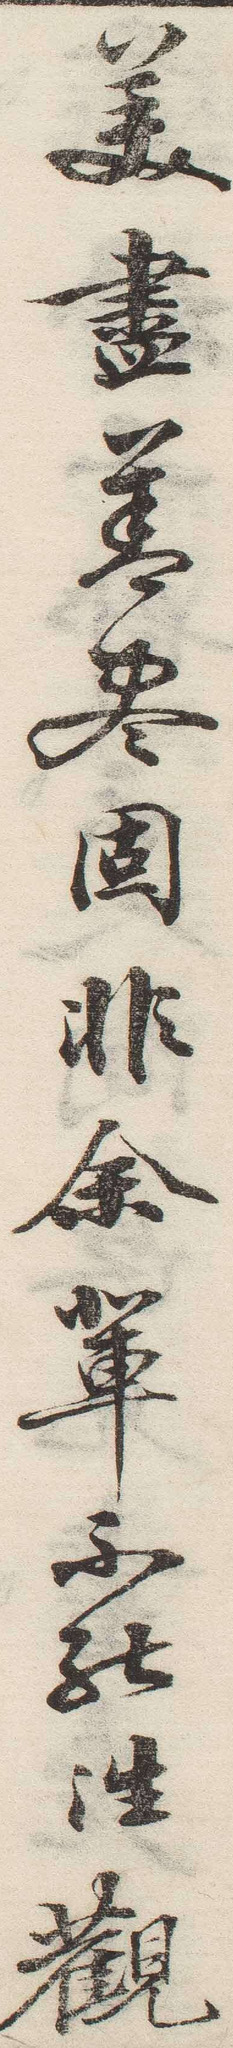美尽善尽。固非余輩不能往観
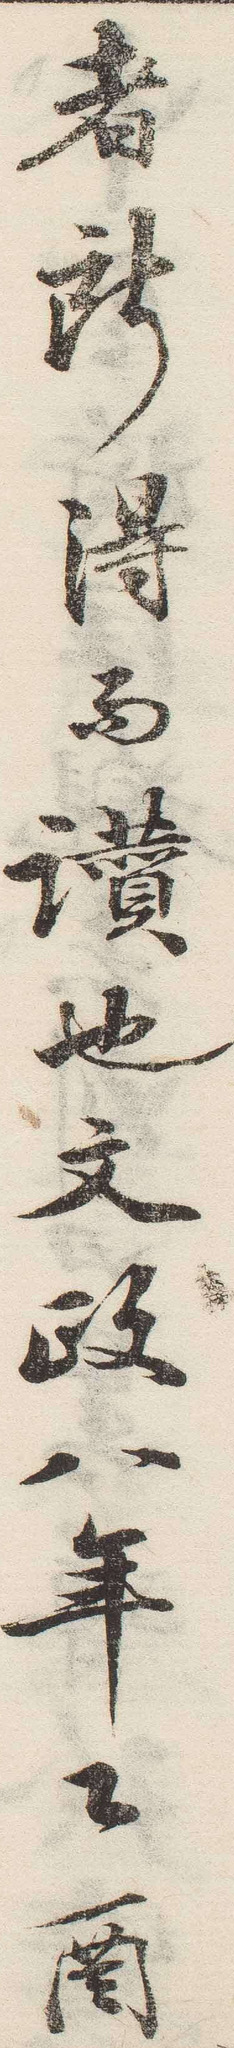者所得而讃也。文政八年乙酉
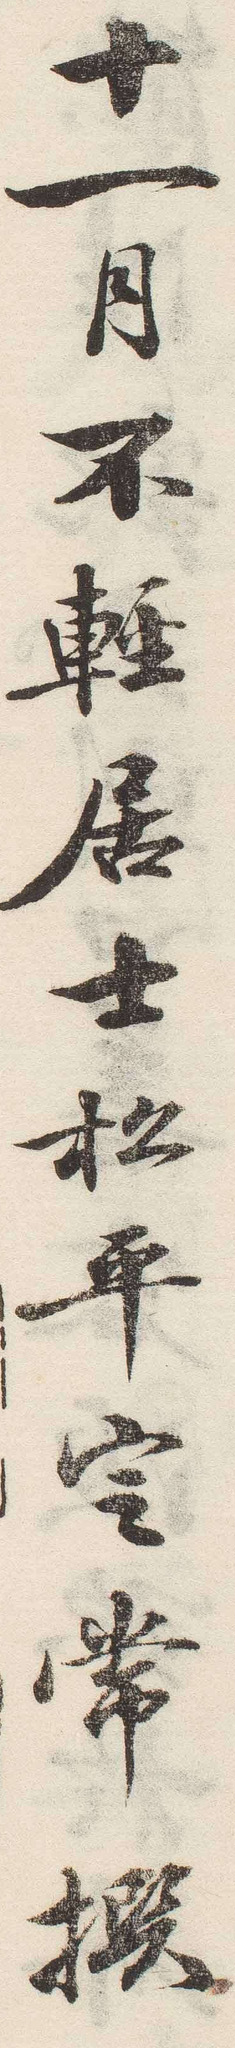十一月不軽居士松平定常撰
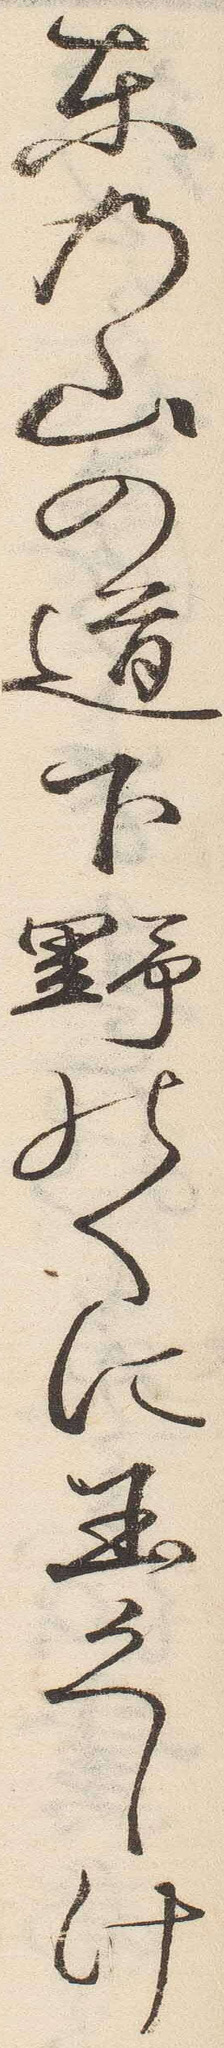東の山の道下野のくに玉くしけ
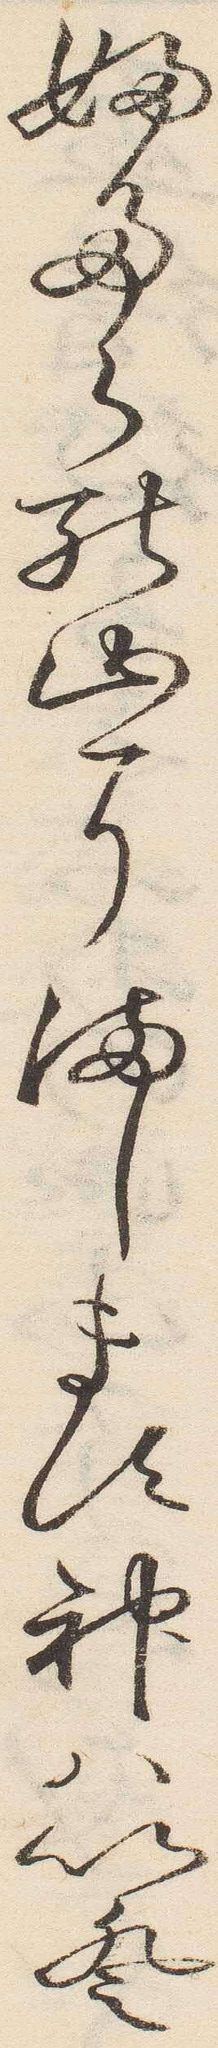ふたらの山にまします神はいと
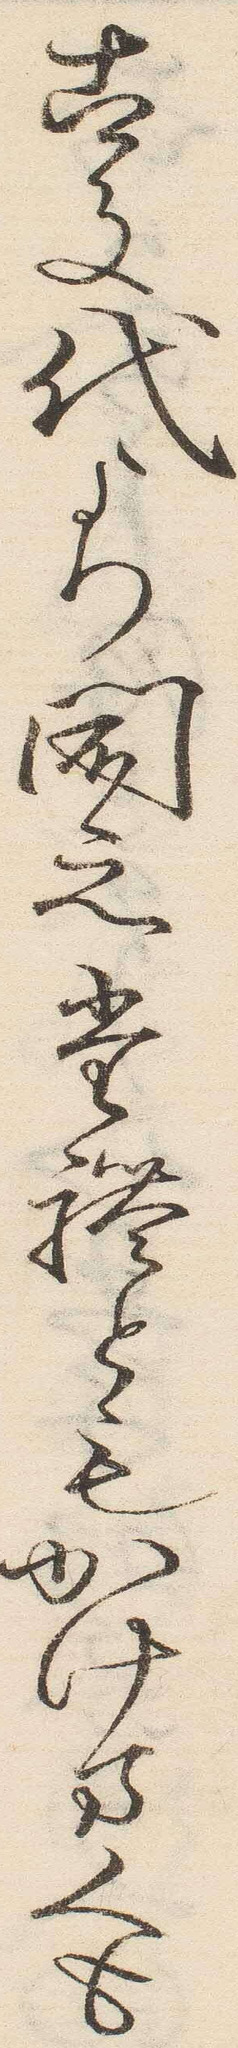古き代より聞えたれともかけまくも
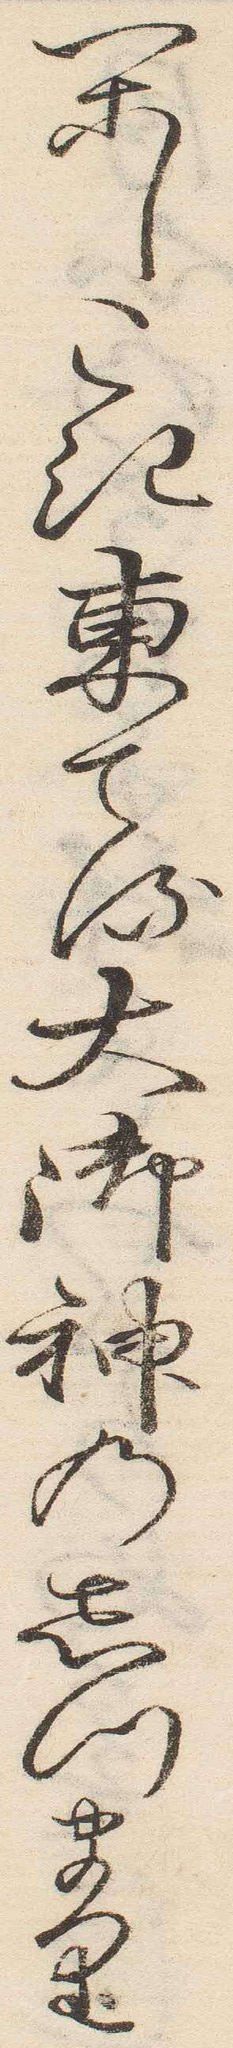かしこき東てる大御神のしつまり
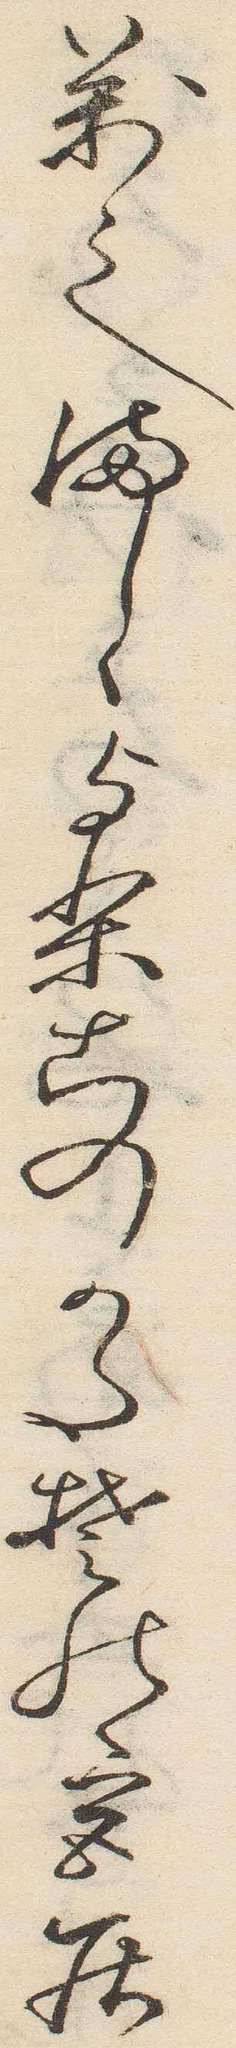ましましゝより古のかたその宮居
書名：日光山志
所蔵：東京学芸大学附属図書館 国文学研究資料館
